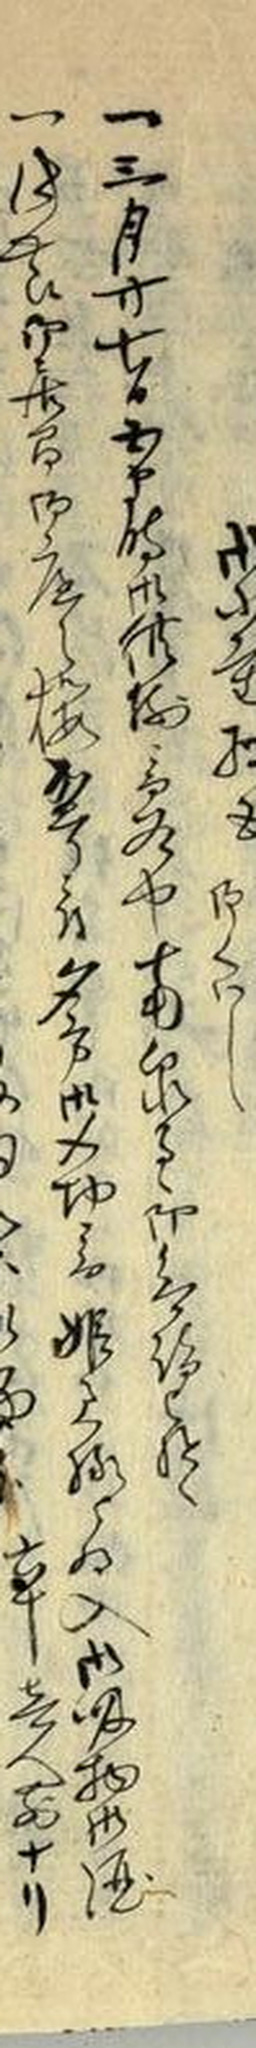一此節御居間御庭之桜盛りニ付夕方御〆切ニ而姫君様被為入御吸物御酒
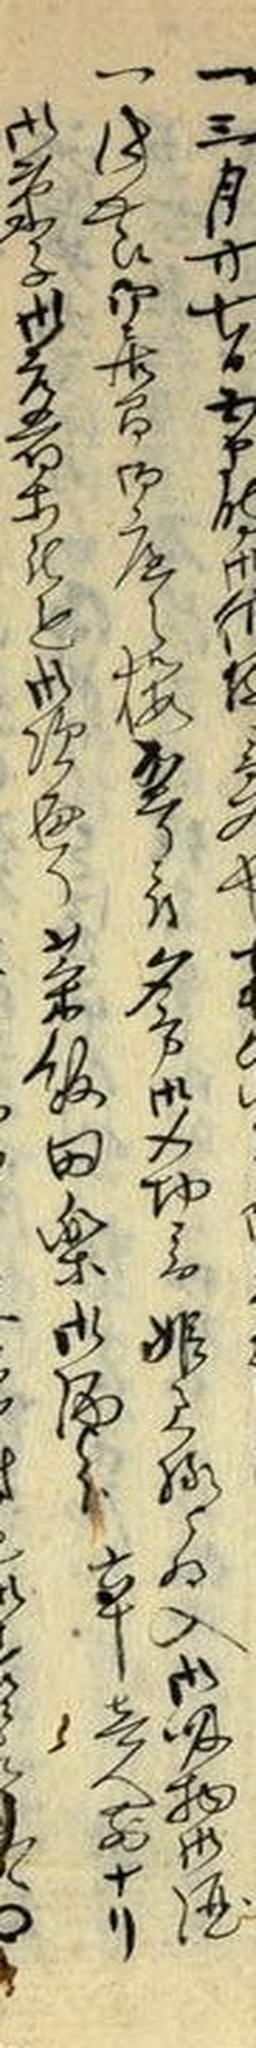御菓子御取肴等被進御次通り菜飯田楽御酒被下六十壱人前ナリ
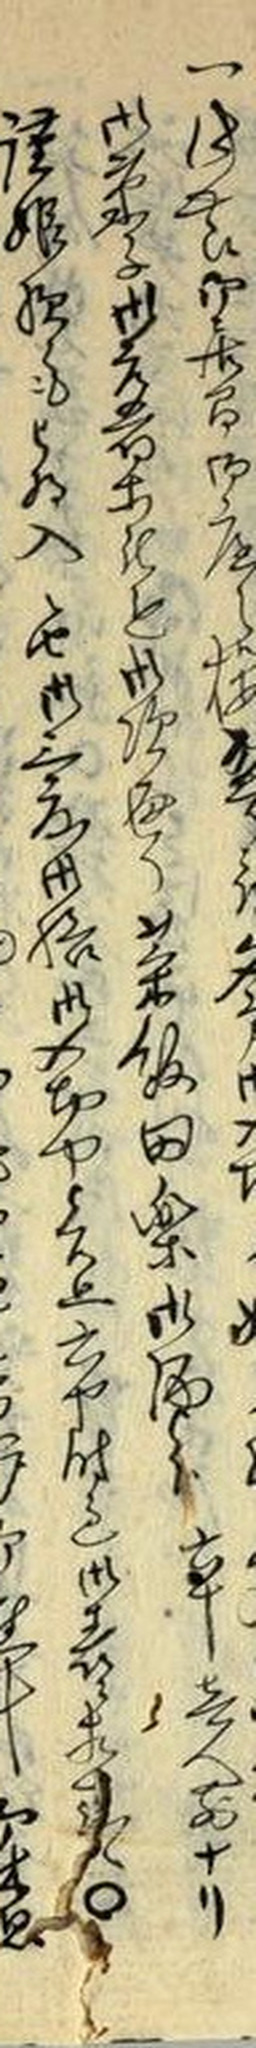謹姫様ニも被為入候由御三度御膳御〆切中差上六半時過御表ニ相成候○
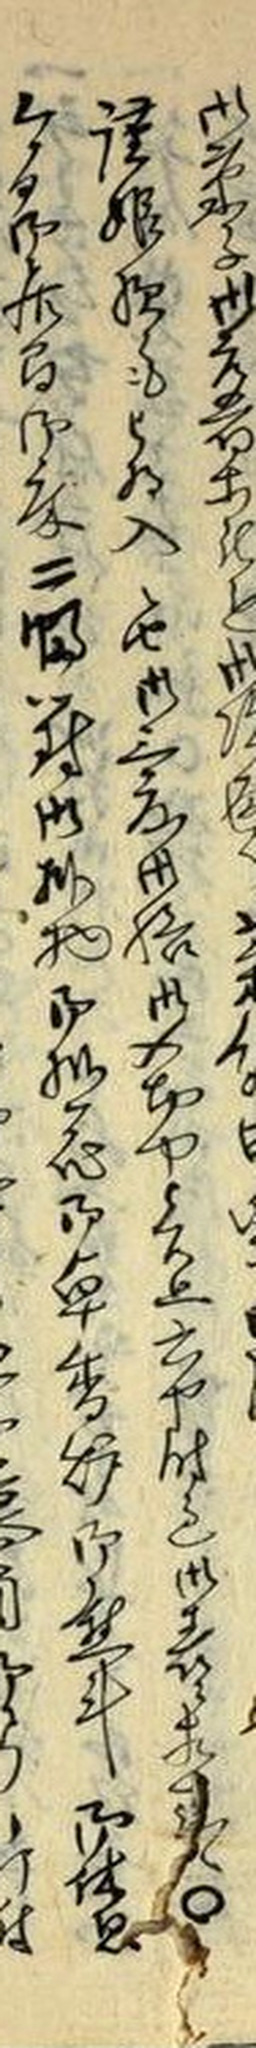今日御居間御床二幅対御掛物御掛花御卓香炉御熨斗御休息
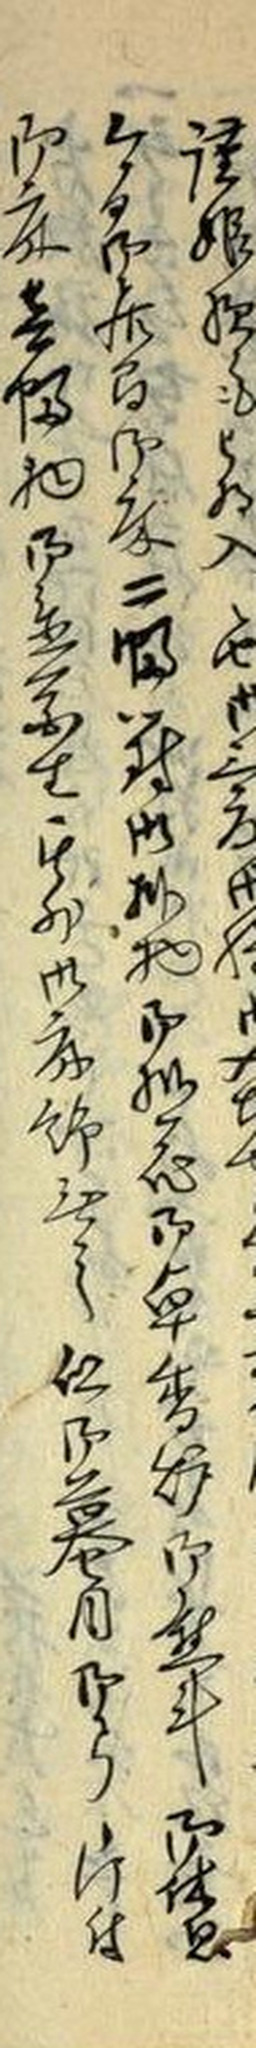御床壱幅物御置花生其外御床飾無之但御蟇目御弓片付
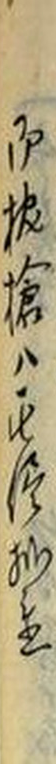御枕槍ハ其侭掛置
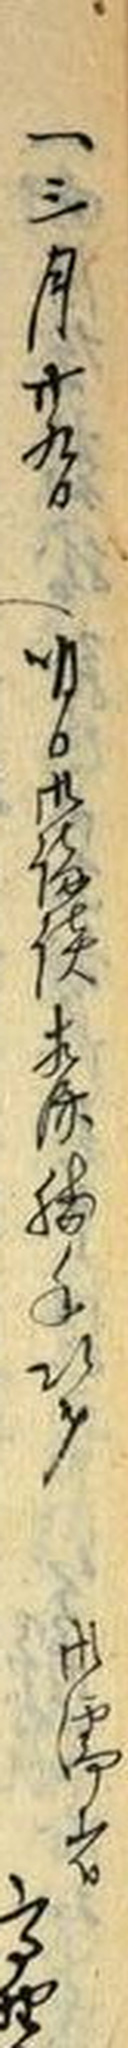一三月廿九日明日御講談相済勝手次第御儒者
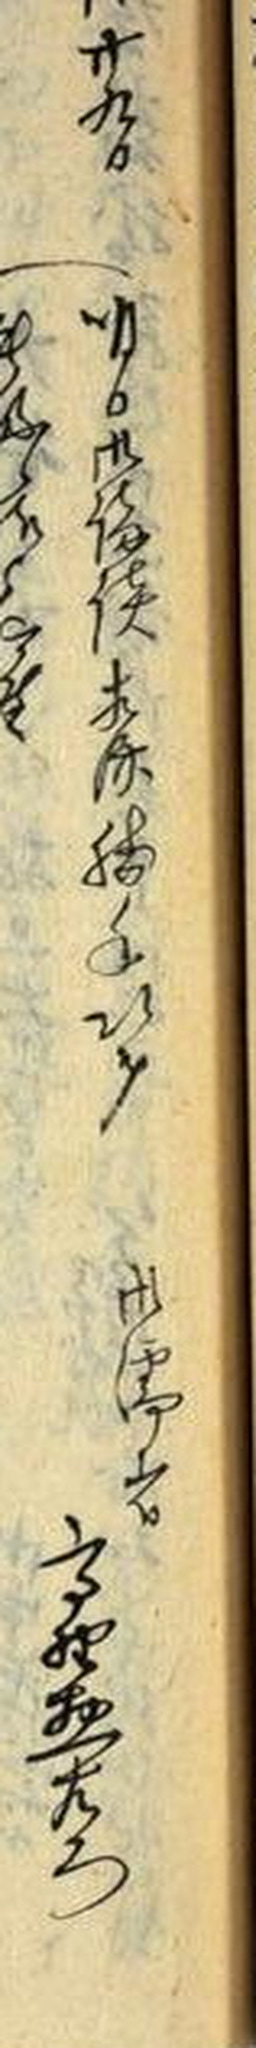罷帰候様被仰付候高野惣左衛門
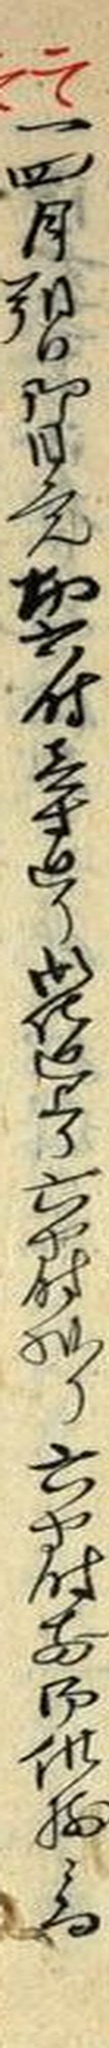一四月朔日御目覚切六時壱寸廻り御仕廻上り六半時掛り六半時前御供揃ニ而
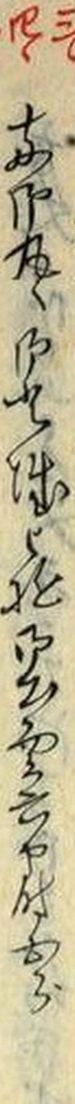両御丸へ御登城被遊御出殿六半時五分
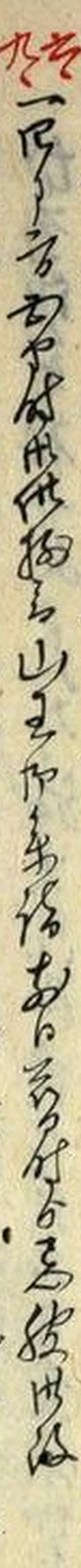一四月二日五半時御供揃ニ而山王御参詣前日暮時ゟ忌服御改
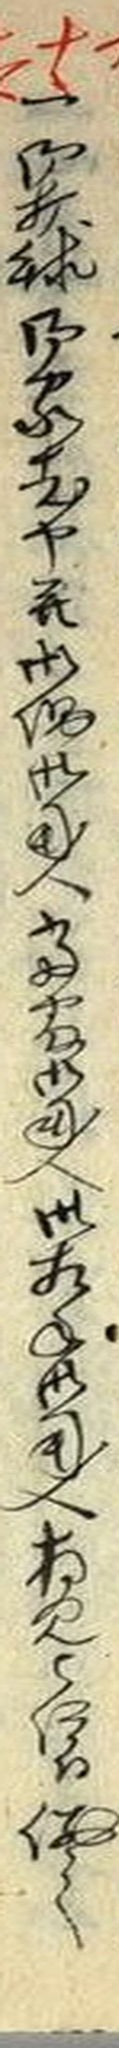一御打毬御家老中并御側御用人当番御用人御相手御用人拝見被仰付例之
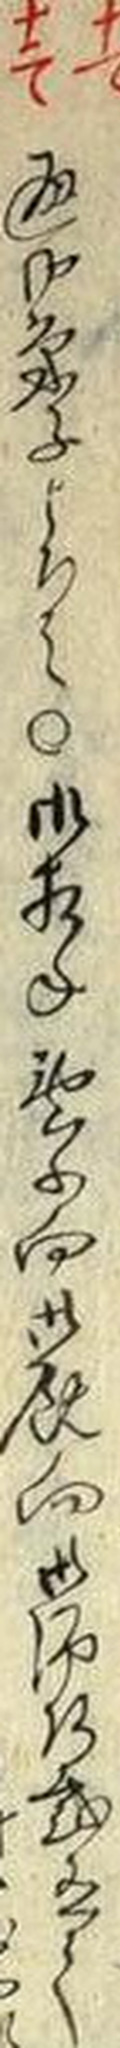通御菓子被下之〇御相手台子向御厩向御酒頂戴有之
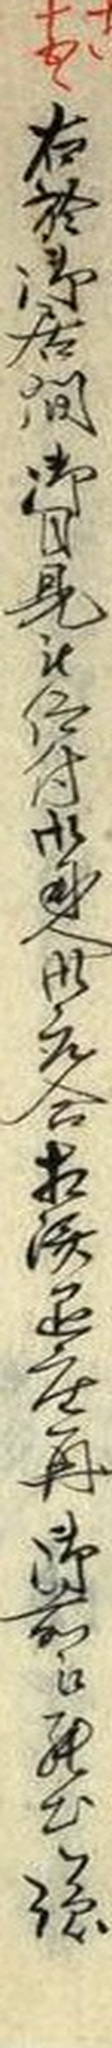右於御居間御目見被仰付御用人御取合相済退座再御前江罷出謙
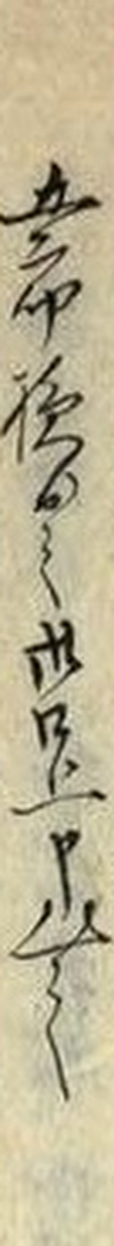五郎様ゟ之御口上申上之
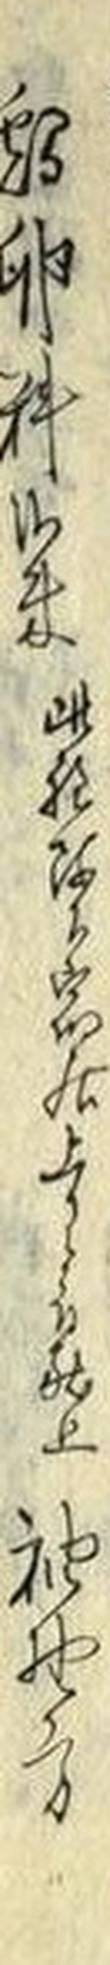鶏卵料弐朱此程致下宿居上り候ニ付献上袖野方
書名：少傅日録抄（斉承付側向頭取日記、在府）
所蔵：福井県文書館 Fukui Prefectural Archives
